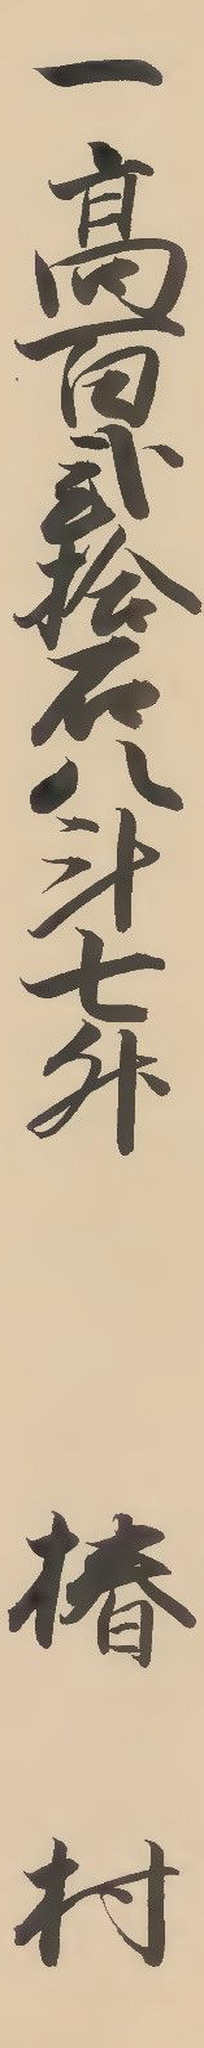一高百弐拾石八斗七升椿村
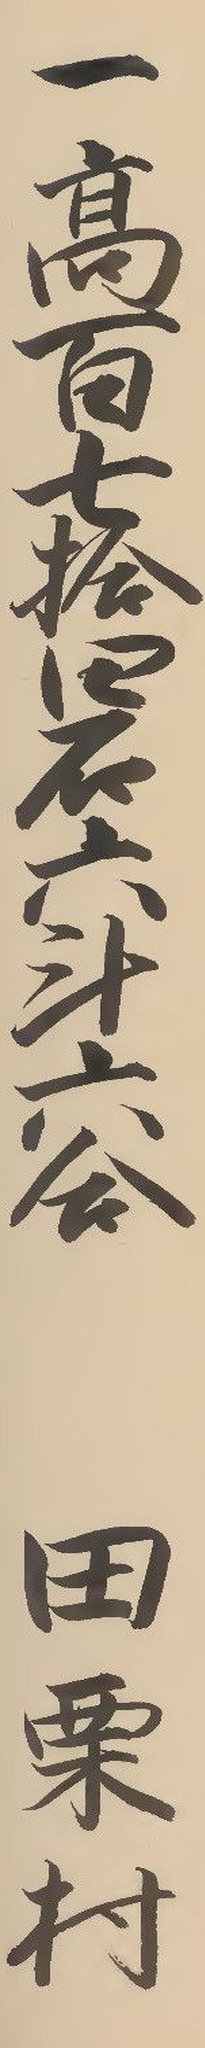一高百七拾四石六斗六合田栗村
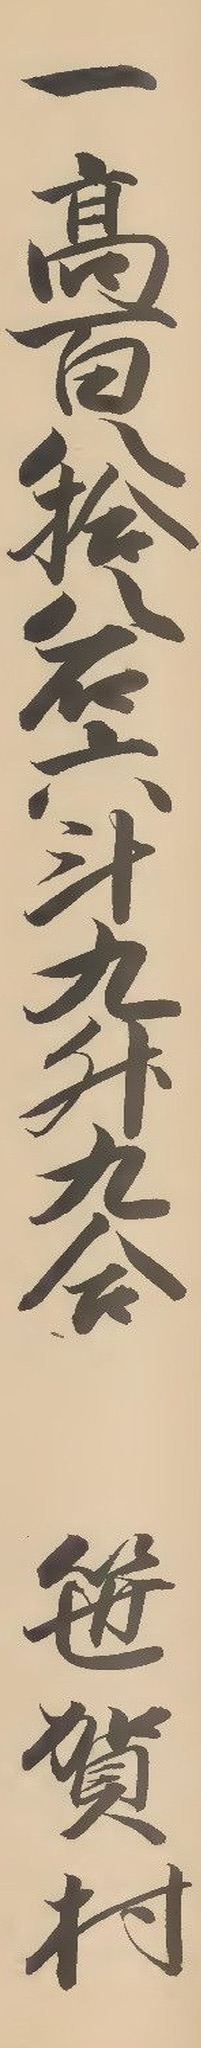一高百八拾八石六斗九升九合笹賀村
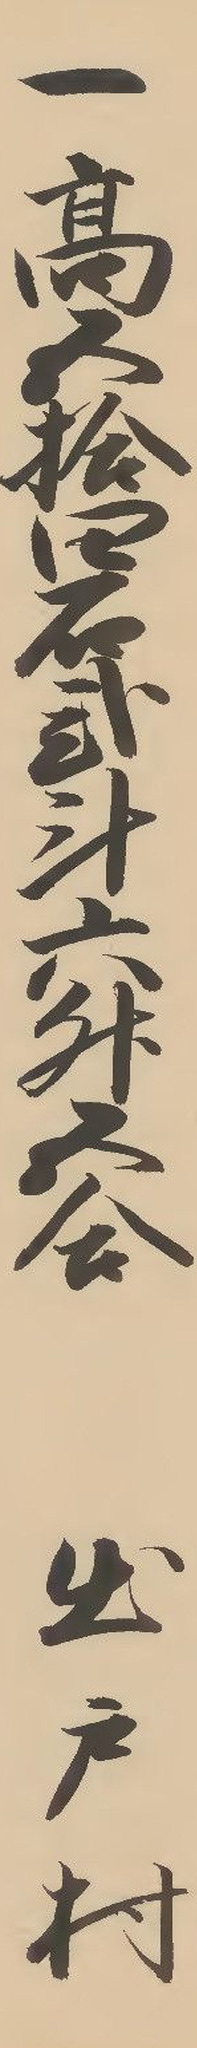一高五拾四石弐斗六升五合出戸村
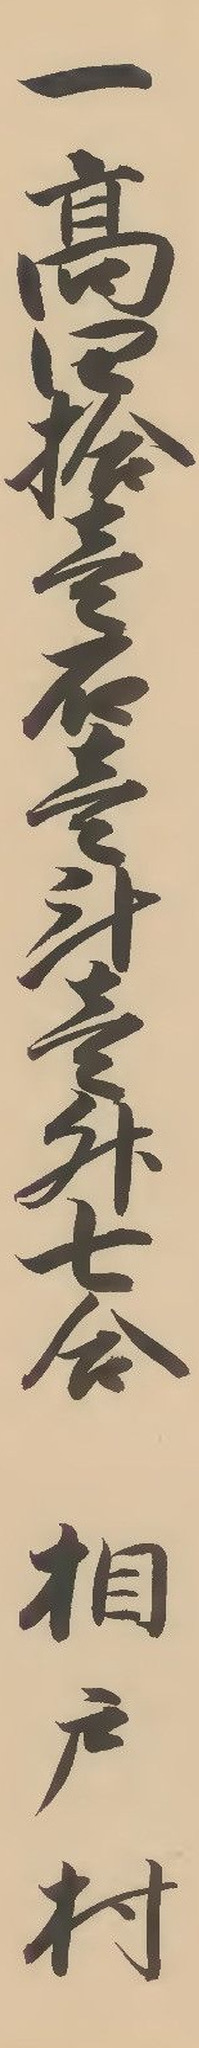一高四拾壱石壱斗壱升七合相戸村

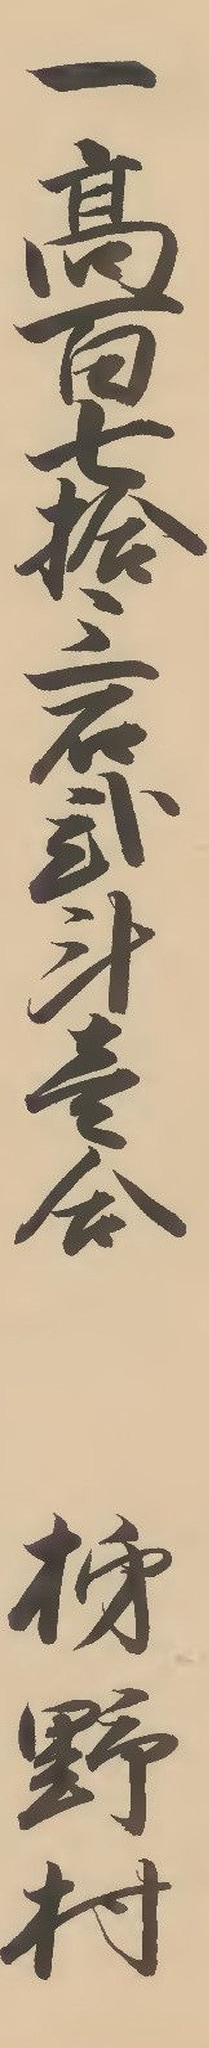一高百七拾三石弐斗壱合柿野村

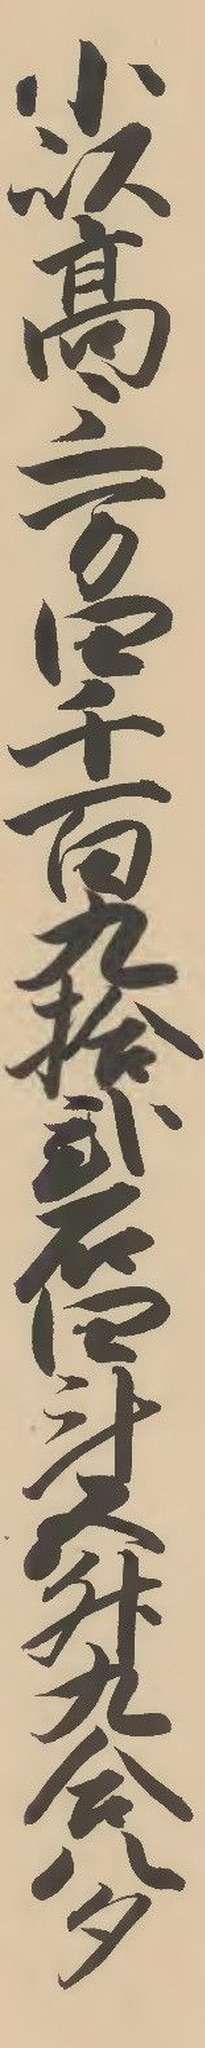小以高三万四千百九拾弐石四斗五升九合八勺

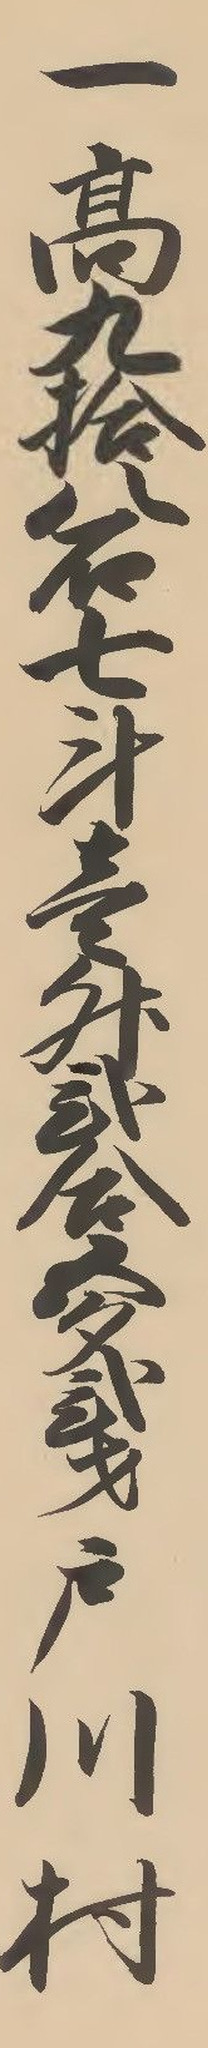一高九拾八石七斗壱升弐合五勺弐才戸川村
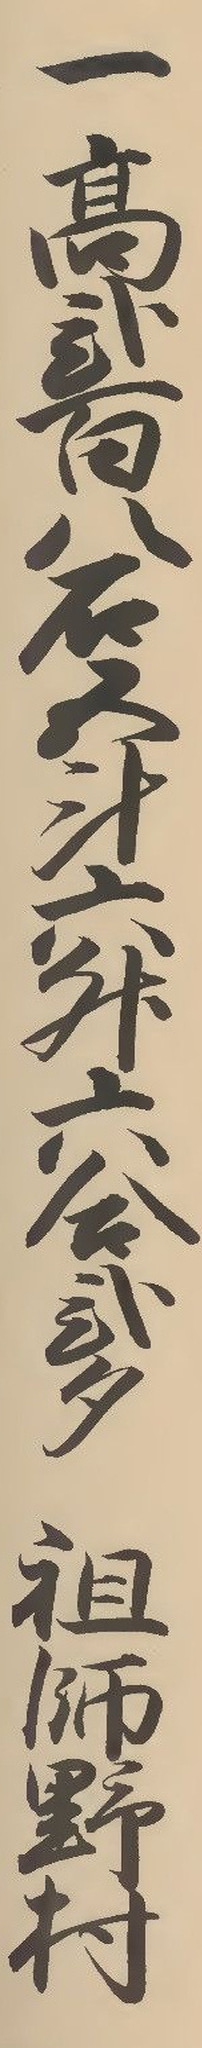一高弐百八石五斗六升六合弐勺祖師野村
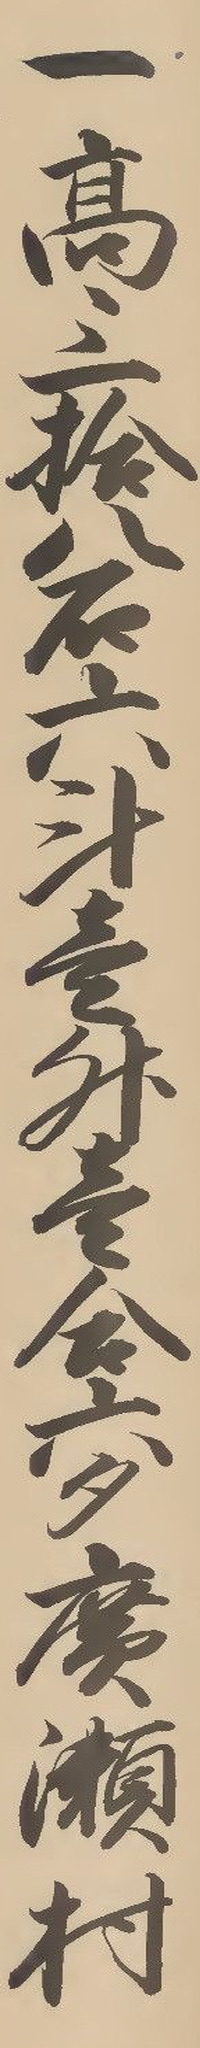一高三拾八石六斗壱升壱合六勺広瀬村
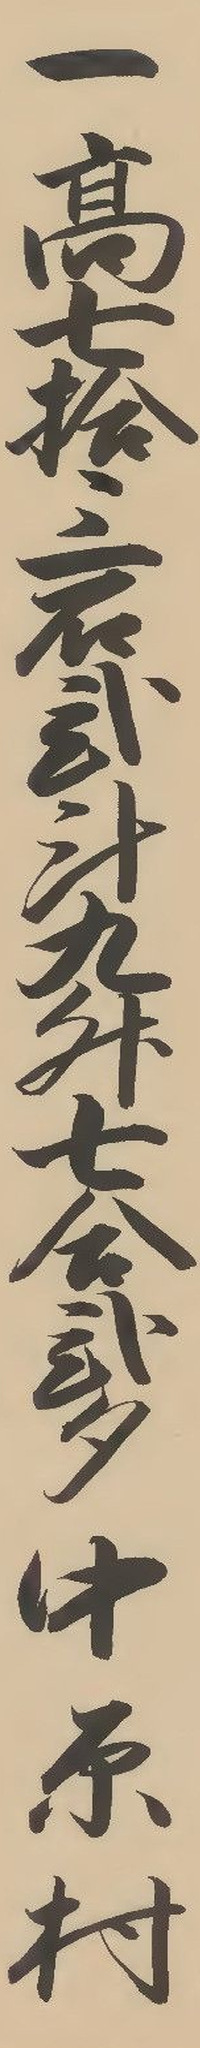一高七拾三石弐斗九升七合弐勺中原村
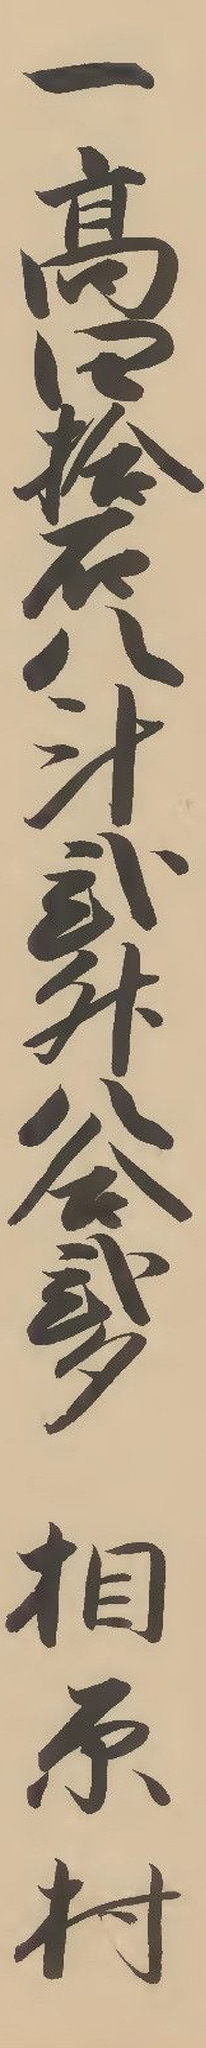一高四拾石八斗弐升八合弐勺相原村
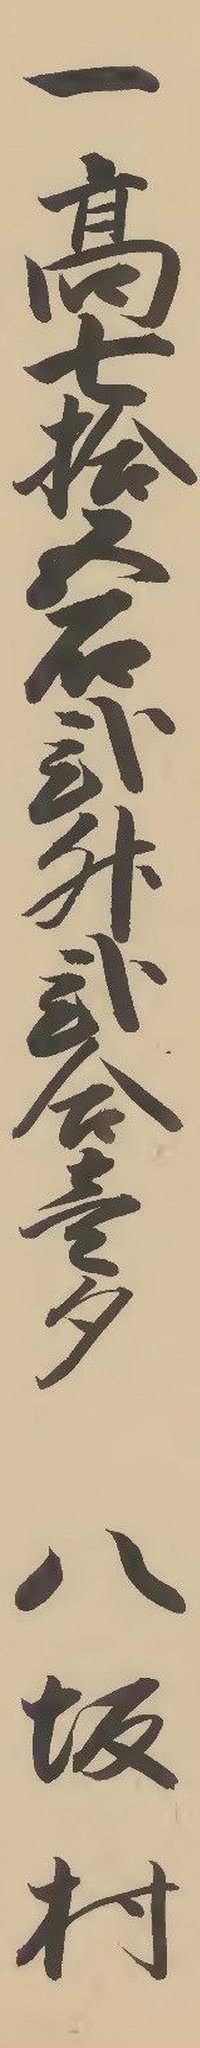一高七拾五石弐升弐合壱勺八坂村

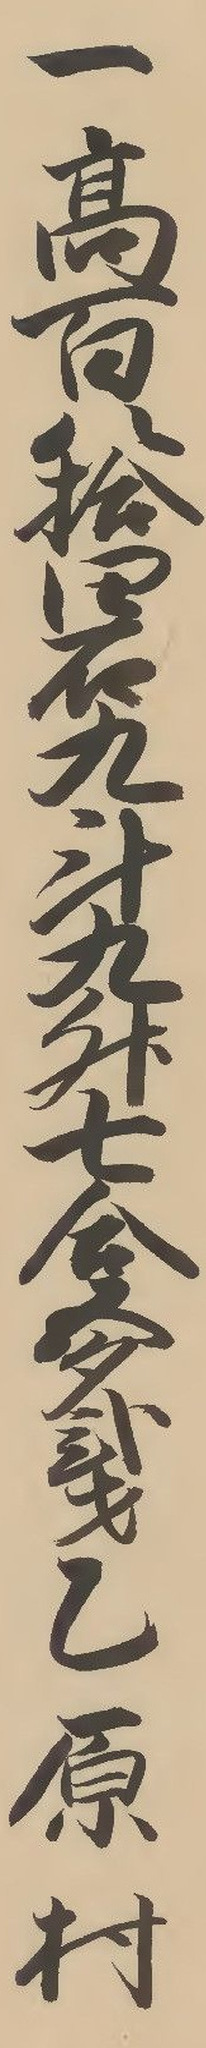一高百八拾四石九斗九升七合五勺弐才乙原村
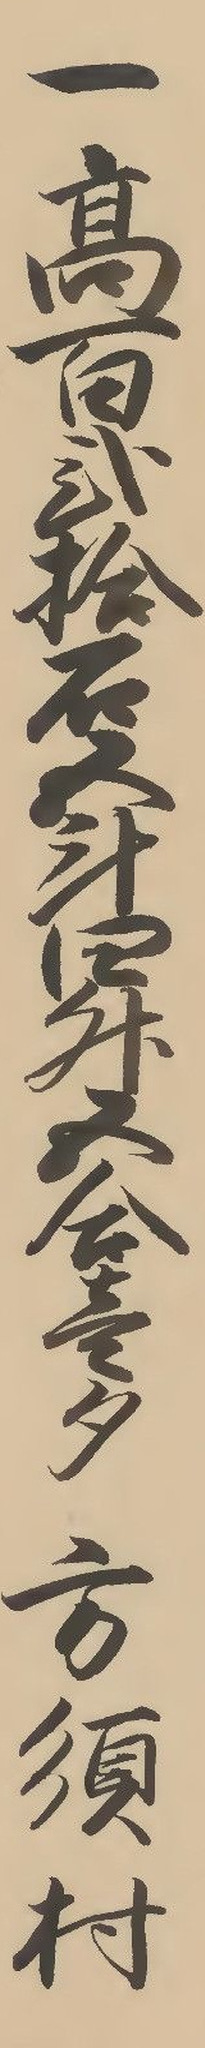一高百弐拾石五斗四升五合壱勺方須村
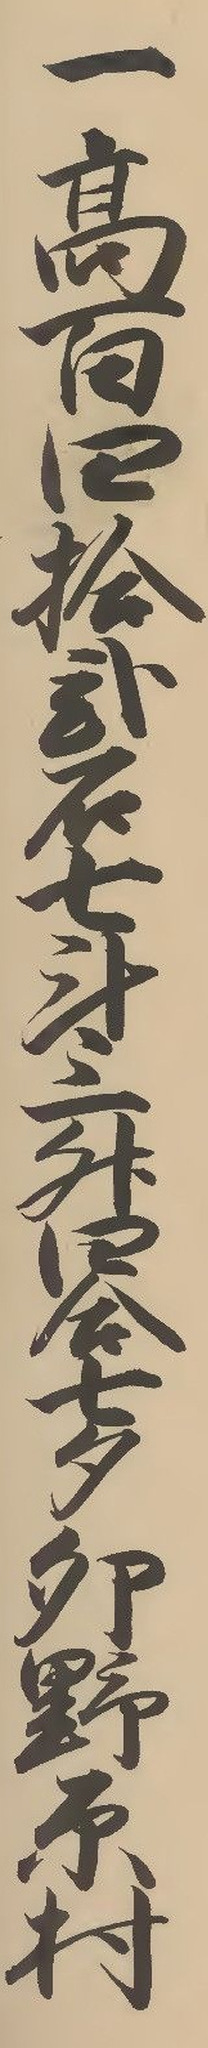一高百四拾弐石七斗三升四合七勺卯野原村
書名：美濃国郷帳
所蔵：国立公文書館 National Archives of Japan
